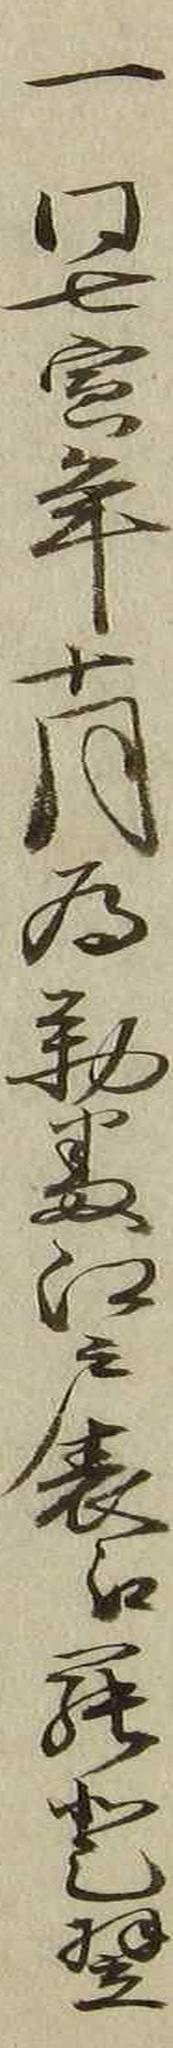一同七寅十月為勤番江戸表江罷登翌
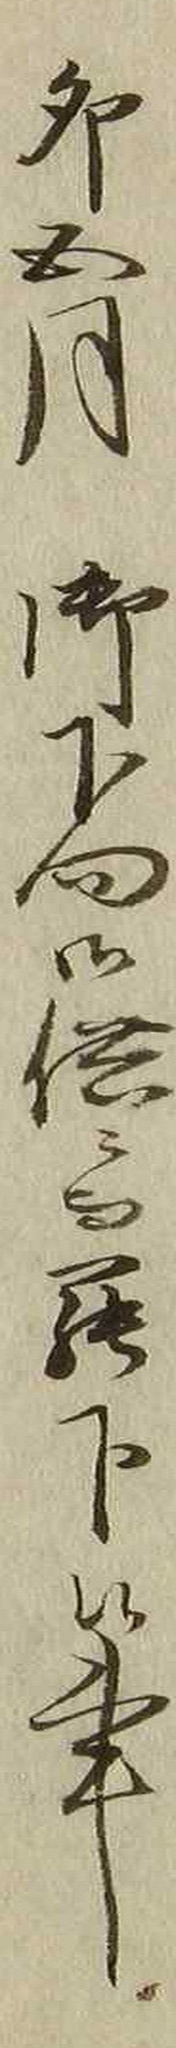夘五月御下向御供ニ而罷下候事
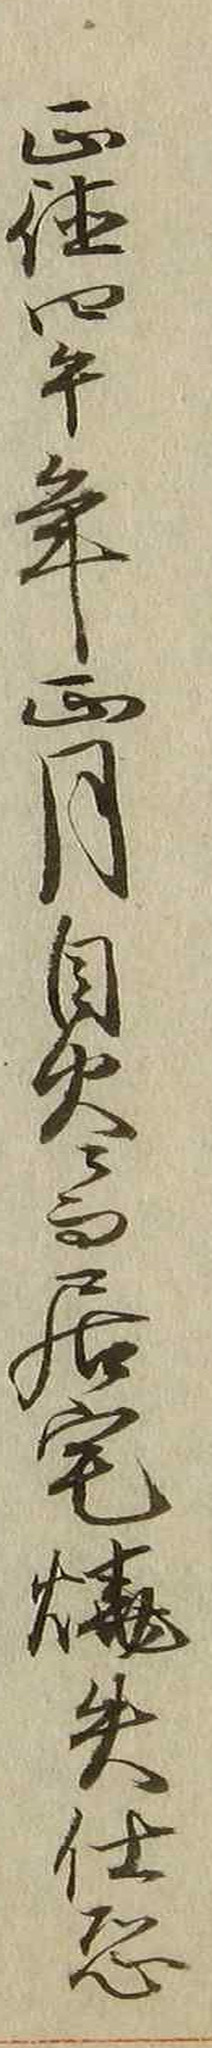一正徳四午年正月自火ニ而居宅焼失仕恐
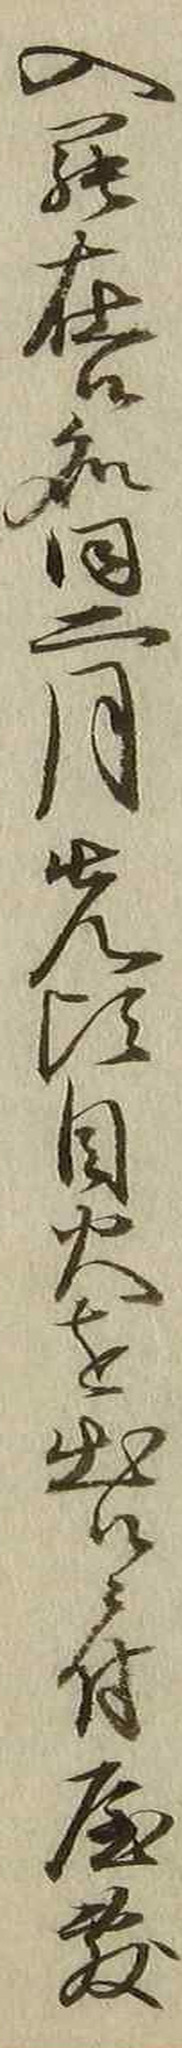入罷在候処同二月先頃自火を出候ニ付屋敷
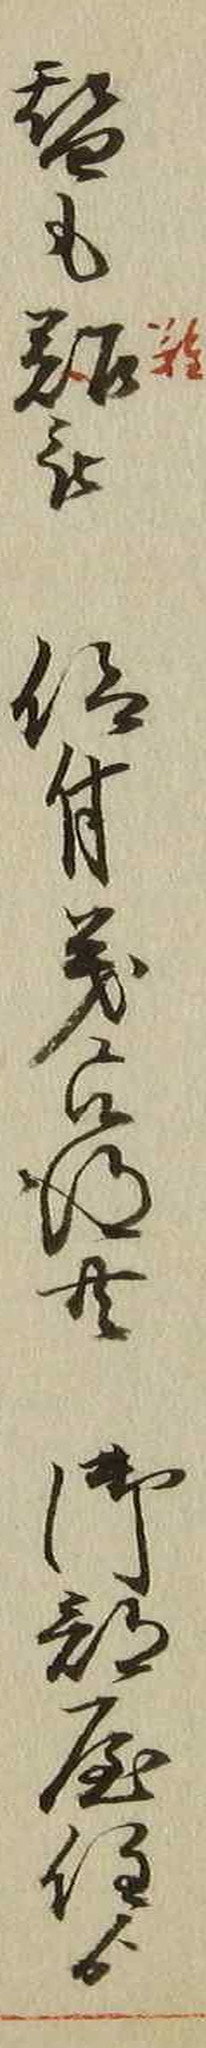替も難被仰付義ニ候得共御部屋住ゟ
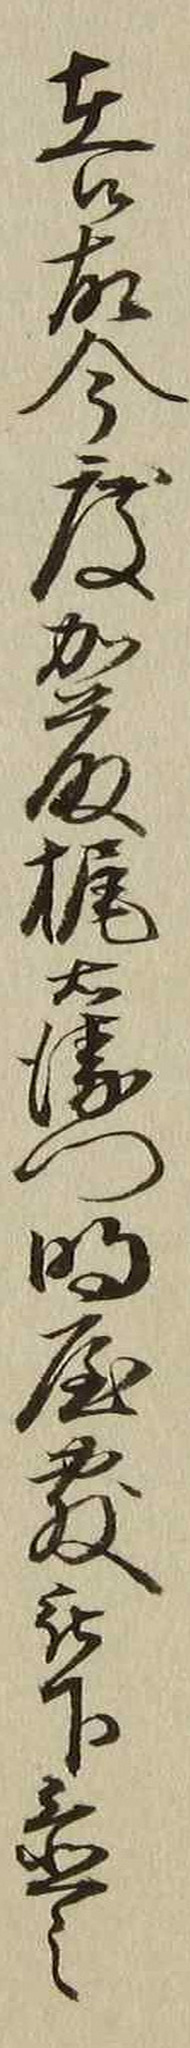在候故今度加藤梶右衛門明屋敷被下置之
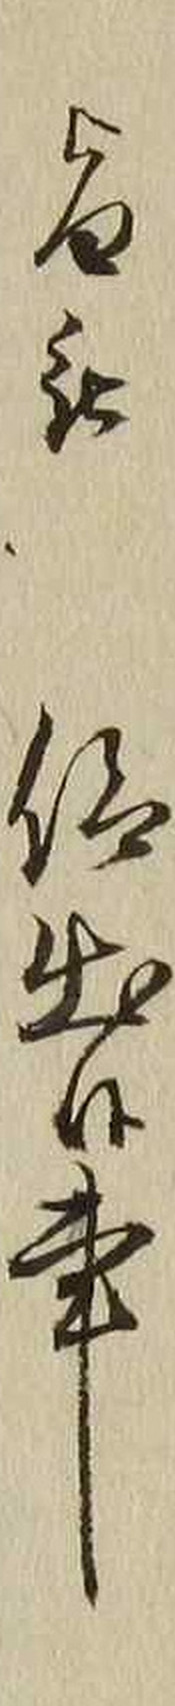旨被仰付候事
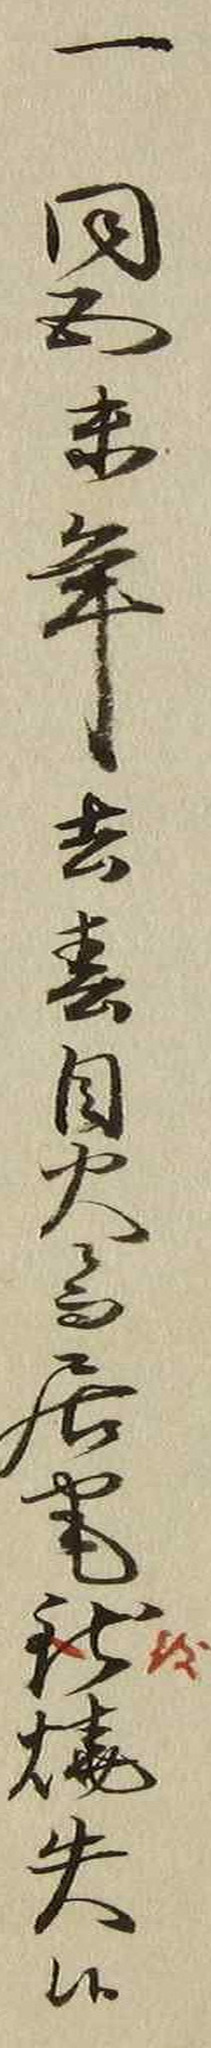一同五未年去春自火ニ而居宅致焼失候
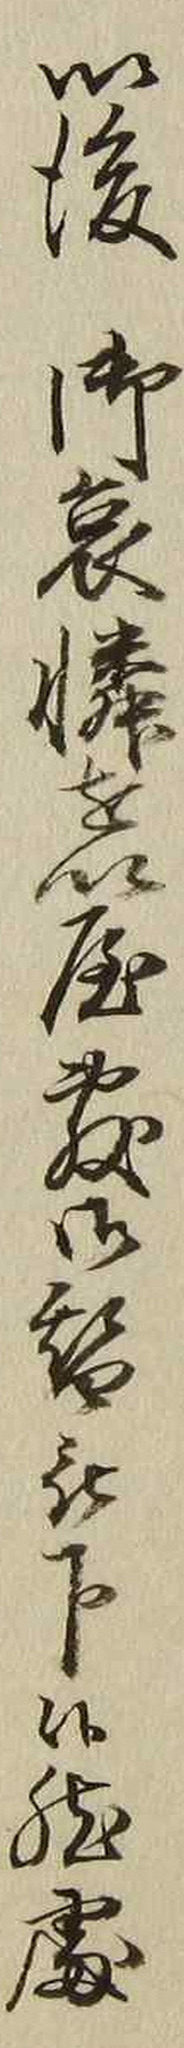以後御哀憐を以屋敷御替被下候然處
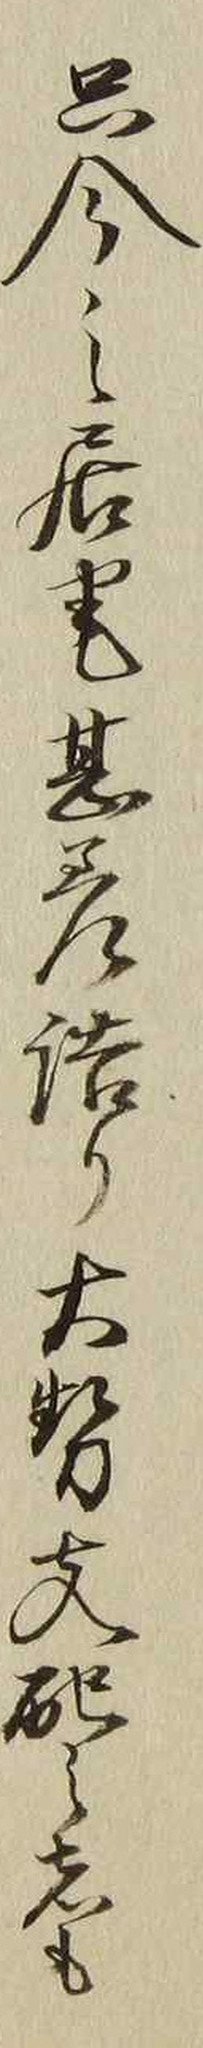只今之居宅甚差詰り大勢支配之者も
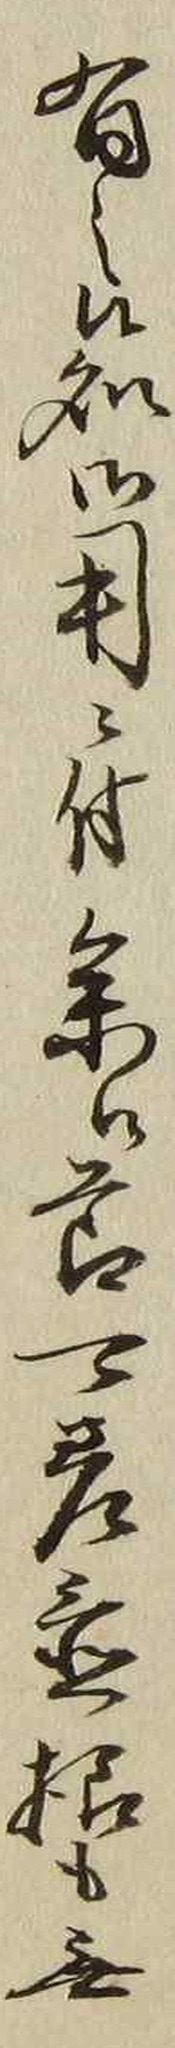有之候処御用ニ付参候節可差置様も無
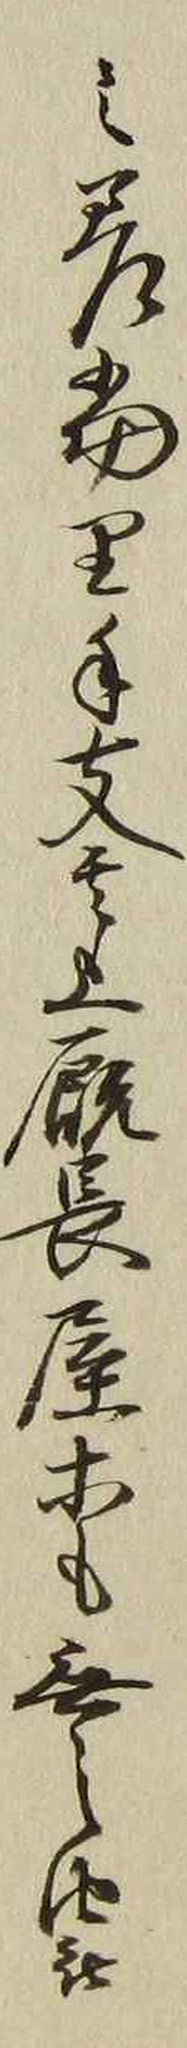之差当り手支其上厩長屋等も無之由被
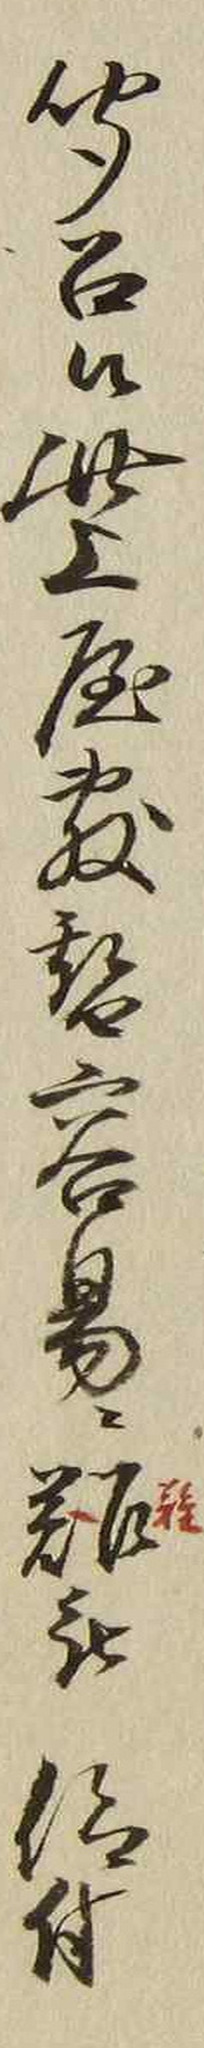聞召候此上屋敷替容易ニ難被仰付
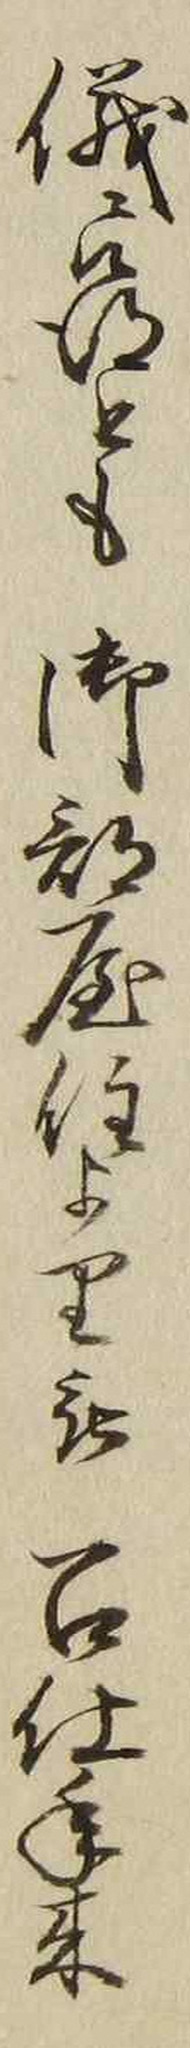儀ニ候得とも御部屋住より被召仕年来
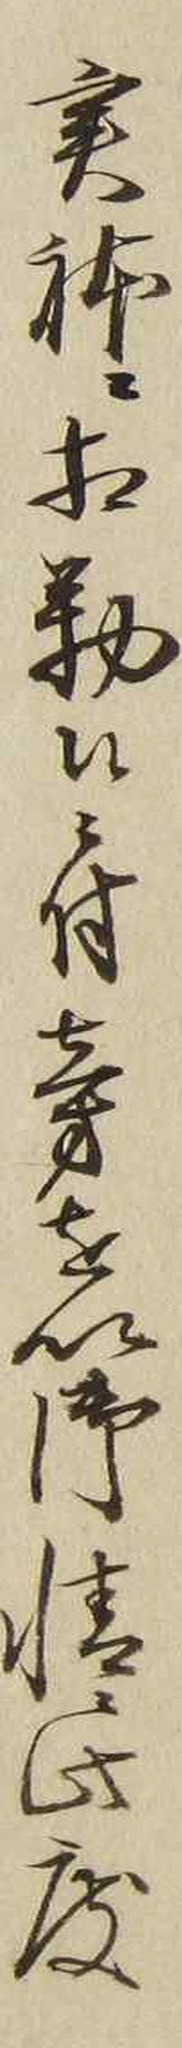実躰ニ相勤候ニ付旁を以御情ニ此度

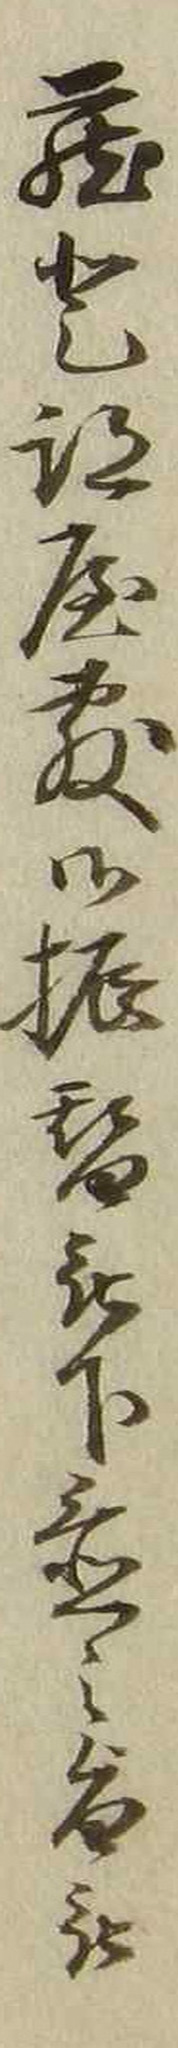蔵登跡屋敷御振替被下置之旨被
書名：諸士系譜　巻之114　か之部22
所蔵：会津若松市立会津図書館
